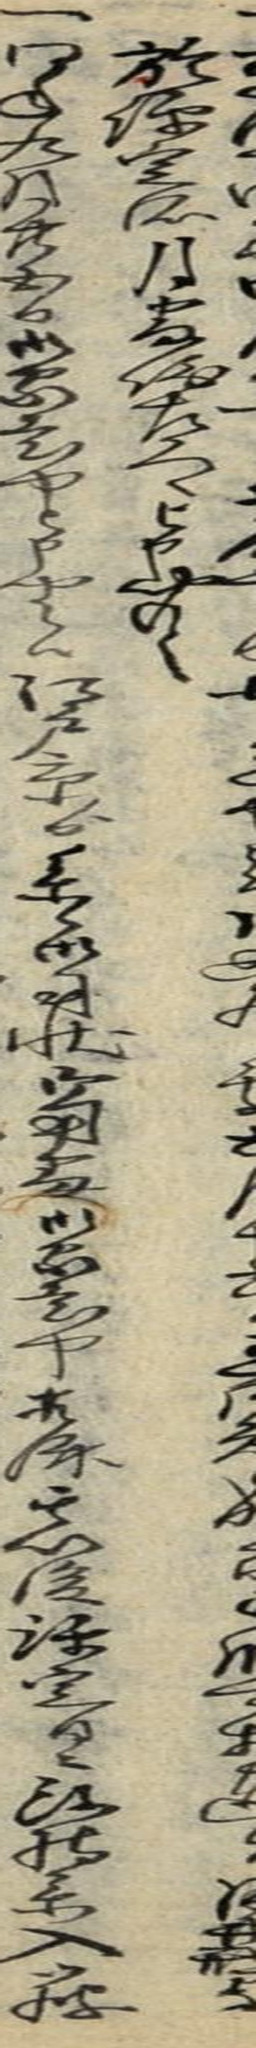一同年九月廿五日御家老中被申聞候は江戸京ゟ参候御用状御用番御家老中相済其以後評定日に致持参入御披
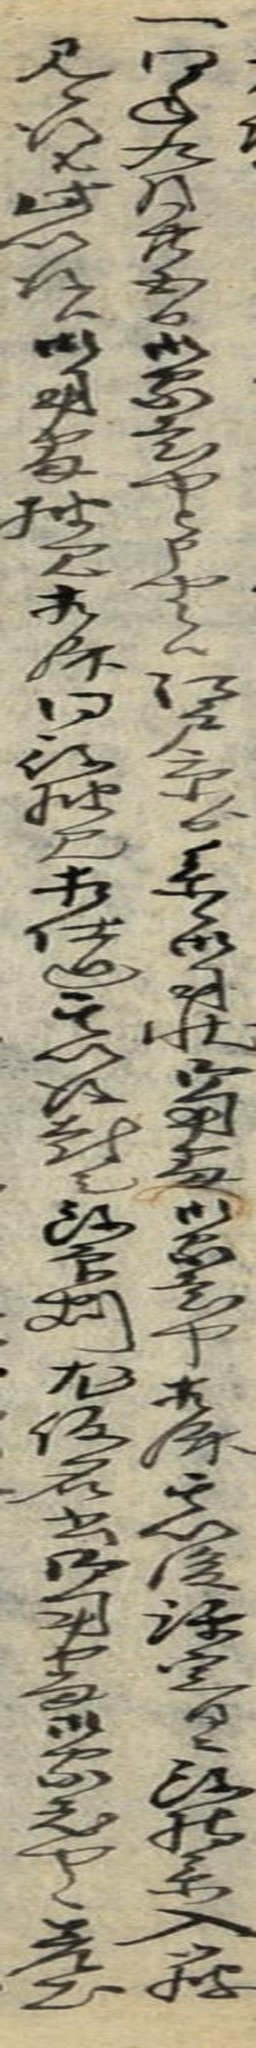見候得共此以後は御用番披見相済同役披見相仕廻其以後封し致印判尤仮名書御用番御家老中へ差出
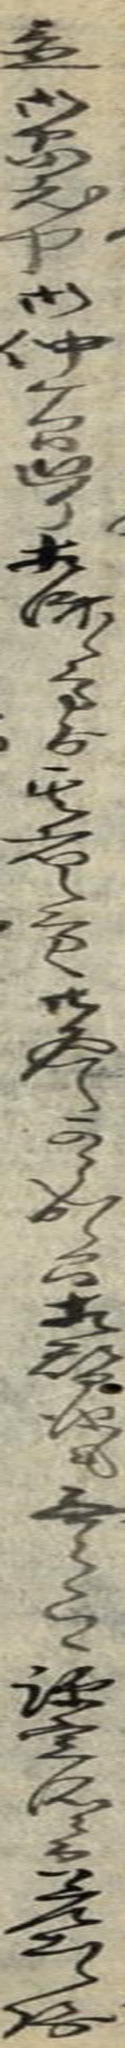置御家老中御仲ヶ間廻り相済候方ゟ其者之方へ御返し可成候間相替候儀も無之候ハゝ評定所に而差出候儀
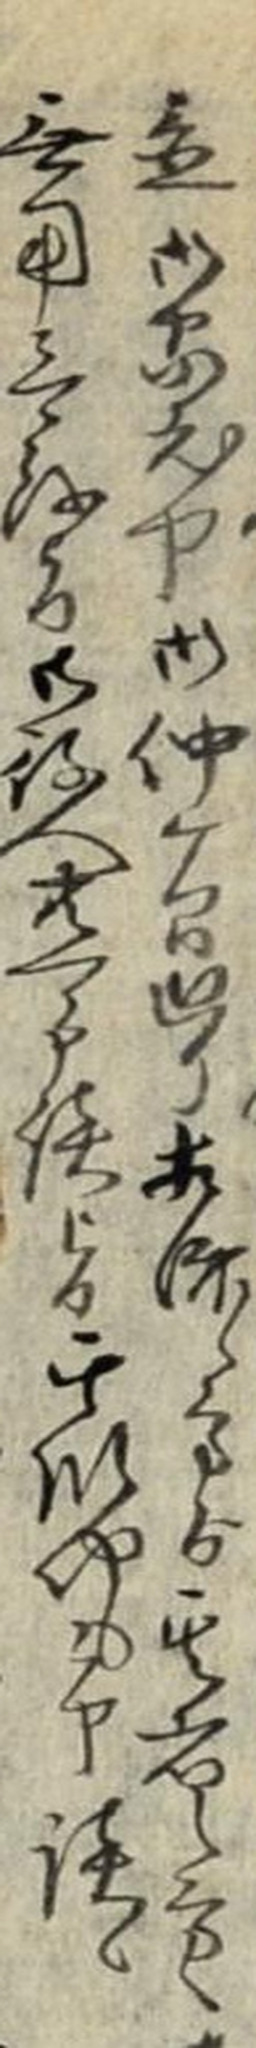無用に可致旨御役人共可申談旨其段何も申談候
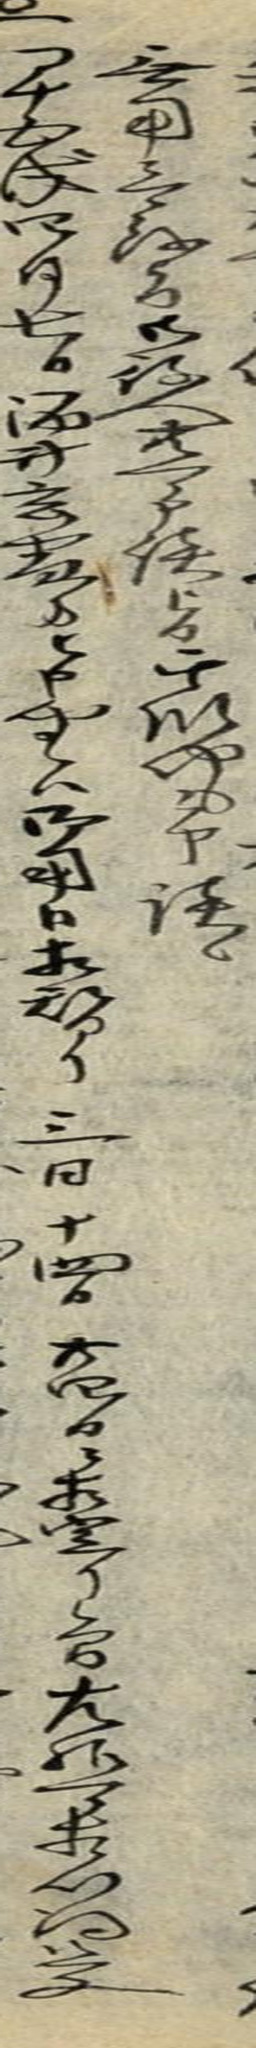○一同十五戌四月七日酒井玄蕃方被申聞候は御用日相替り三日十四日廿四日に相定り候間左様可相心得且又
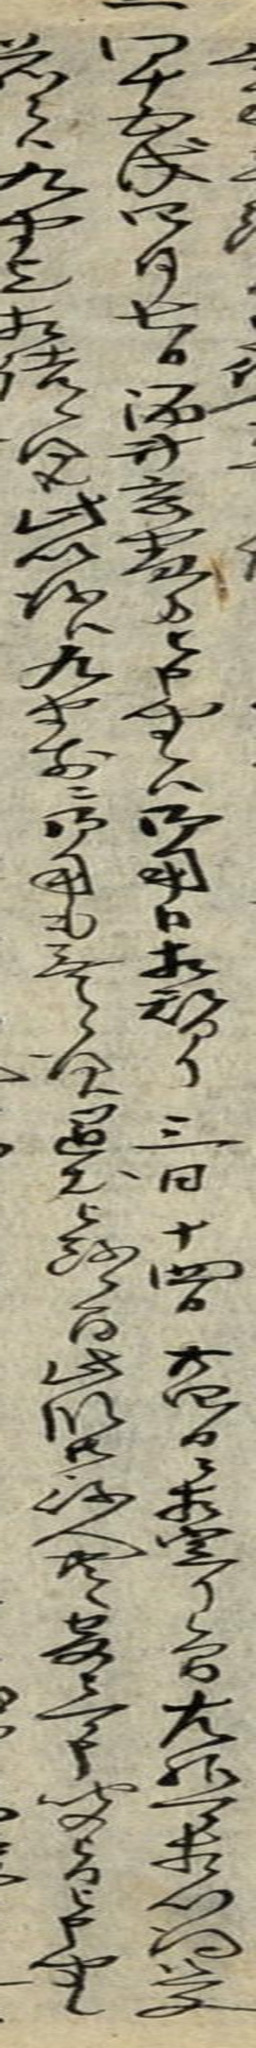前々は九半迄相詰候得共此以後は九半前に御用も無之候得は退出被致候間此段御役人共へ寄々可申聞旨被申聞候
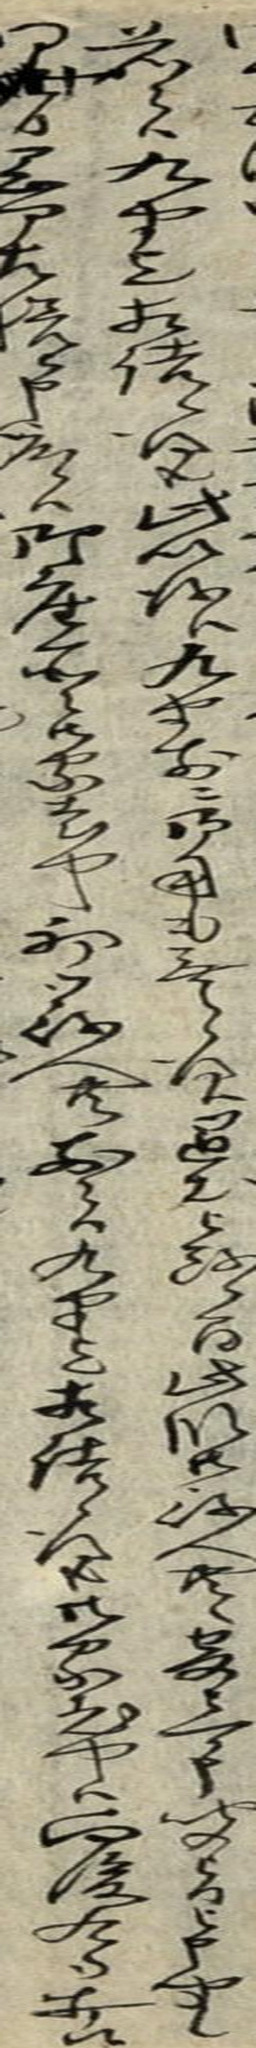同十日岡部左膳被申渡候は御座所之御家老中初御役人共前々は九半迄相詰候得共御家老中は向後九ッ打候
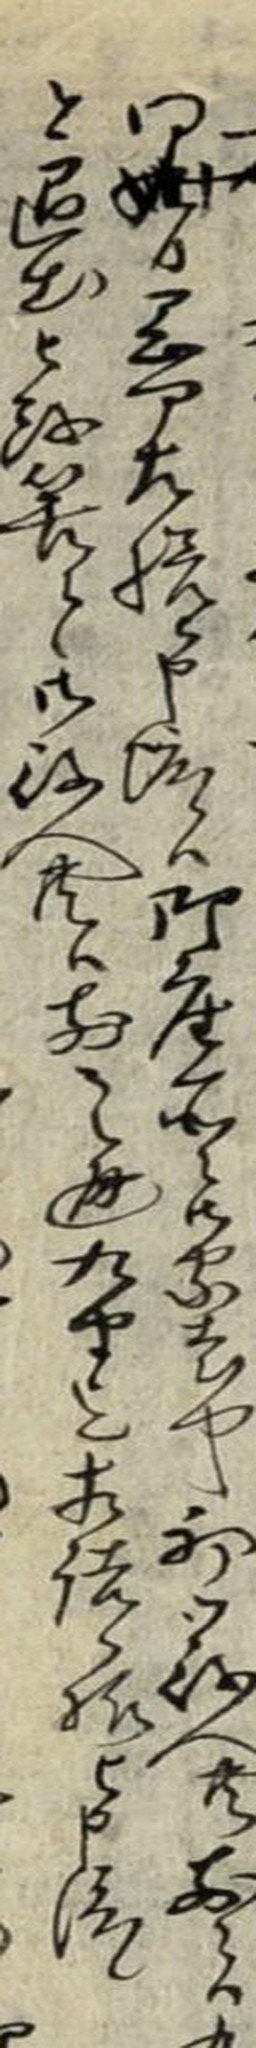と退出被致筈に候御役人共は前々之通九半迄相勤候様被申渡候
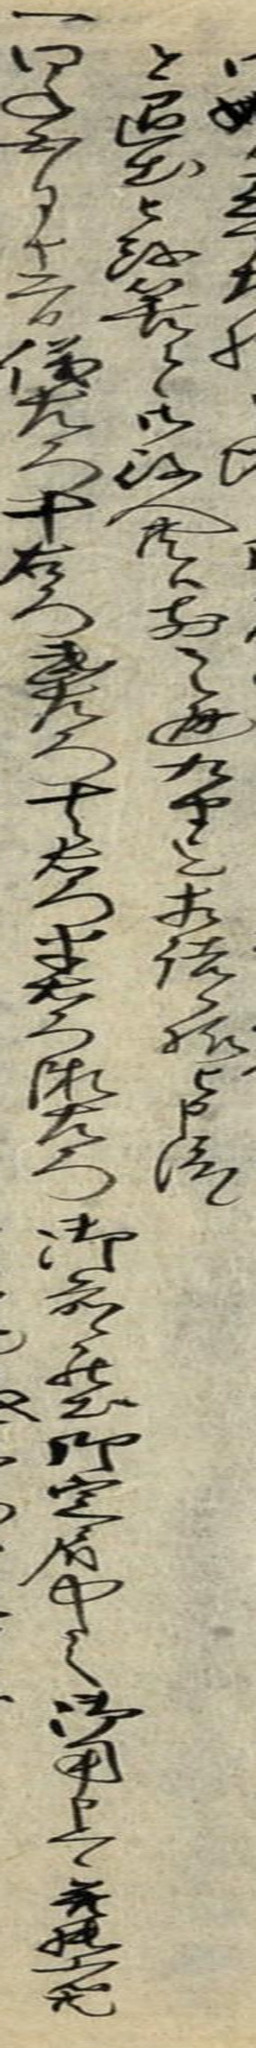一同年五月十二日儀左衛門十右衛門武左衛門十郎右衛門半右衛門瀬左衛門御前へ罷出御定府中之御用申上候并拙者共
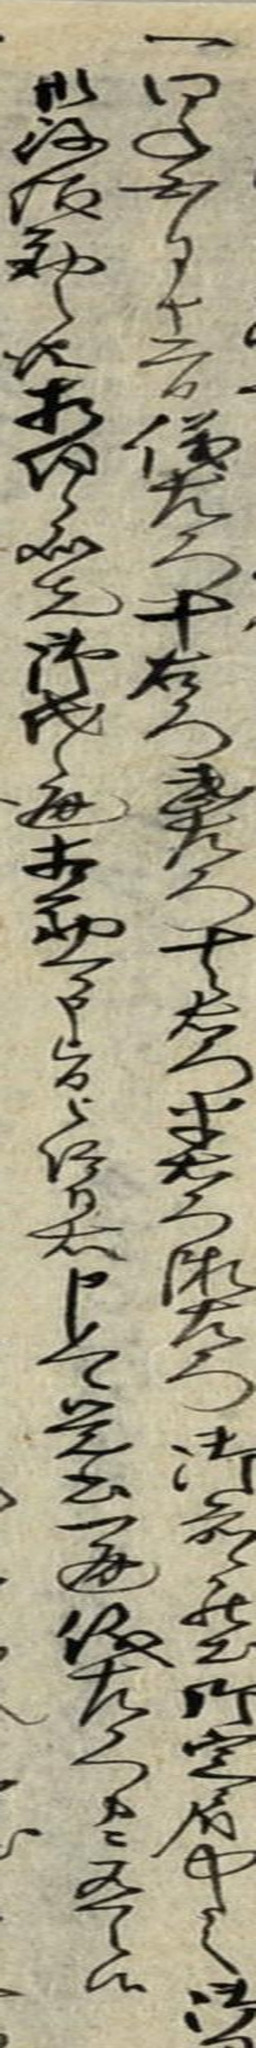御役儀勤候儀相伺候処先御代之通相勤可申旨被仰付右申上候覚書一通儀左衛門方に有之候
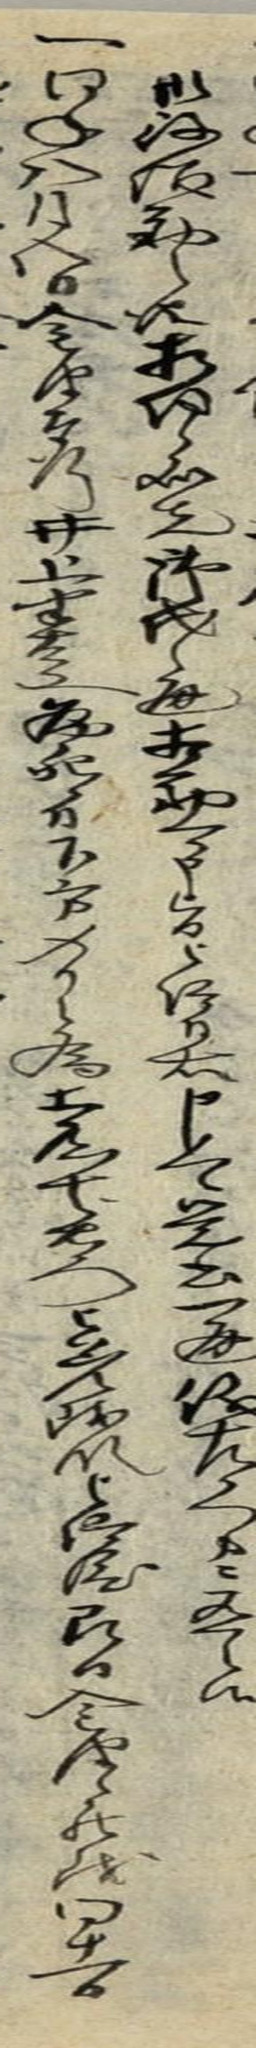一同年八月八日金津奉行井上半太夫病死に付下方〆り之為土屋十郎右衛門被差越候段被仰渡即日金津へ罷越同十一日
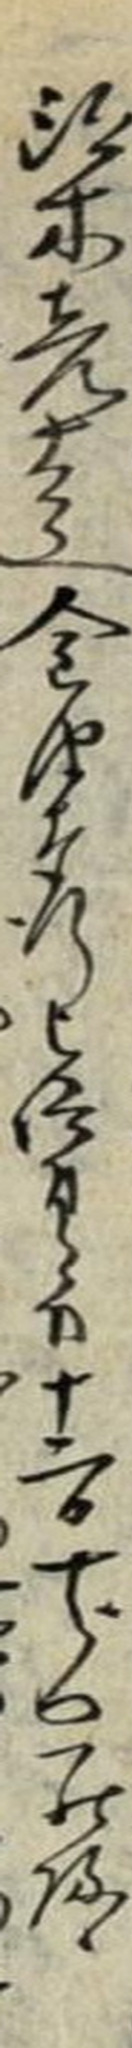鈴木彦太夫金津奉行被仰候に付十二日十郎右衛門罷帰候
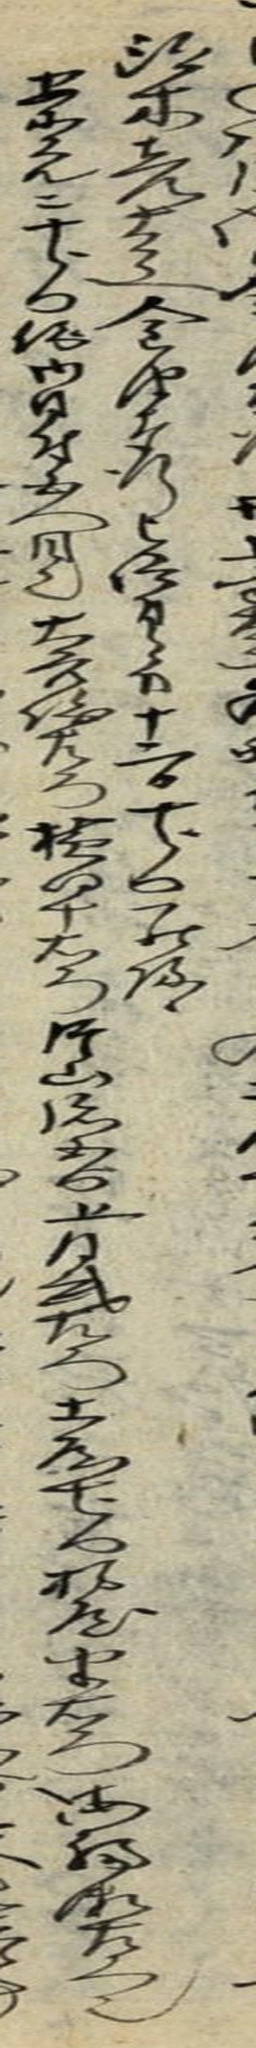案するに十郎右衛門儀御目付五人目也大谷儀左衛門横田十右衛門片山弥五右衛門上月武左衛門土屋十郎右衛門栃屋半右衛門海福瀬左衛門也
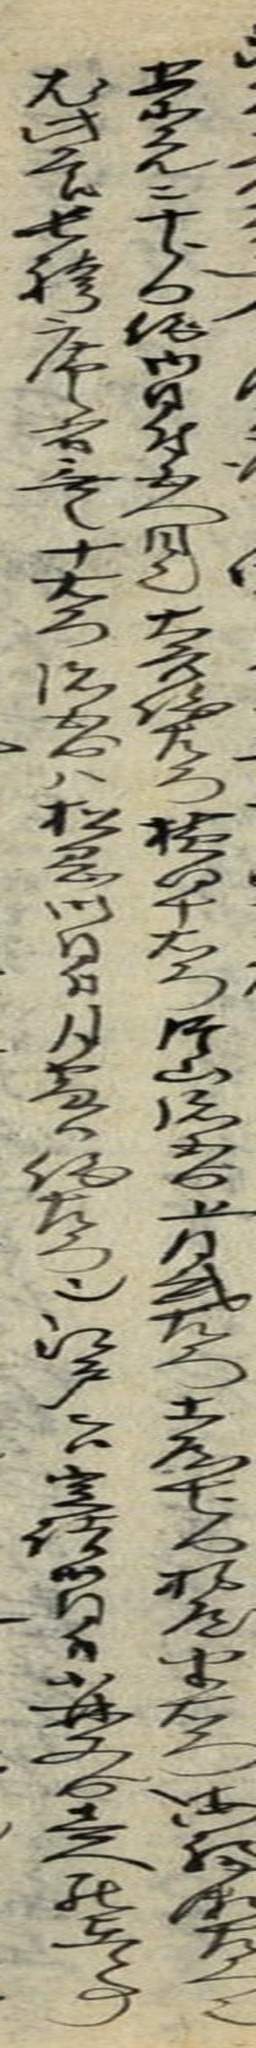尤此節長袴席之者無之十右衛門弥五右衛門は松岡御目付月番は儀左衛門也江戸には常詰御目付小林又右衛門壱人罷在候事
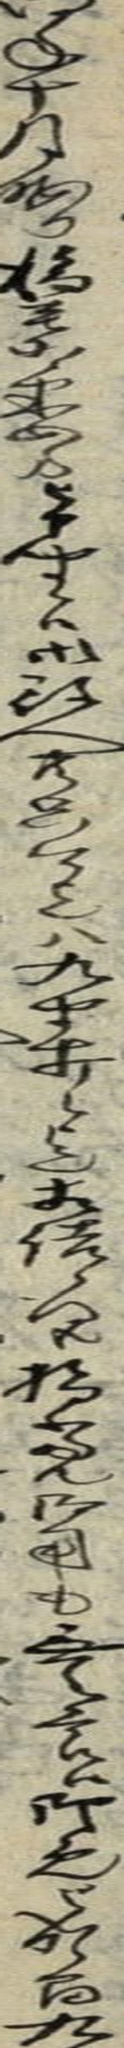○一同年十月晦日稻葉采女方被申聞候は御役人共只今迄は九半打候迄相詰候得共指当る御用も無之節は御免被成候間九ッ
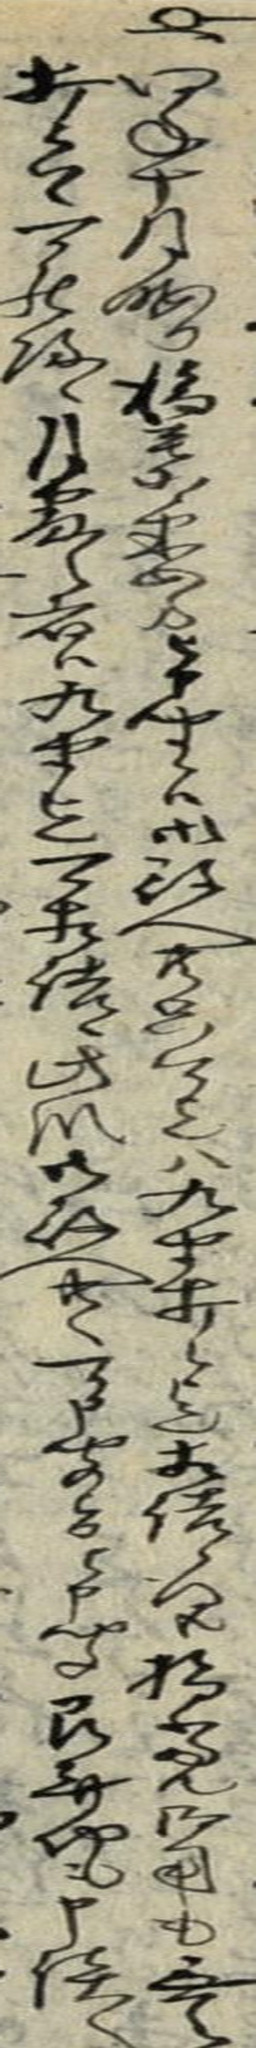打候はゝ可罷帰候月番之者は九半迄可相詰候此段御役人共へ可申聞旨被申聞即刻何も申談候
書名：蒐輯之部
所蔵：福井県文書館 Fukui Prefectural Archives
